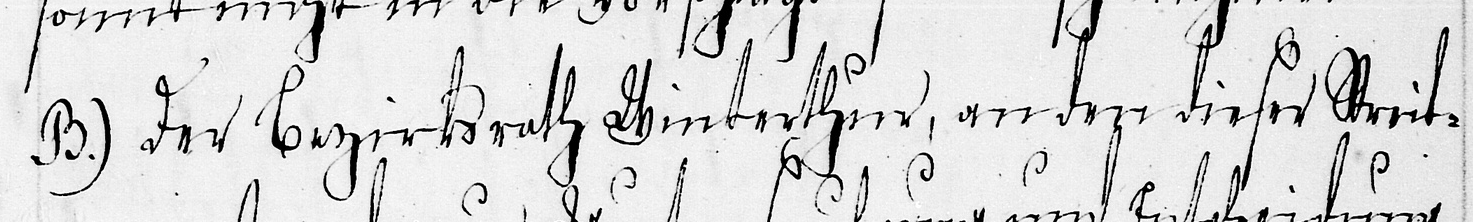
B.) Der Bezirksrath Winterthur, an den dieser Streit¬
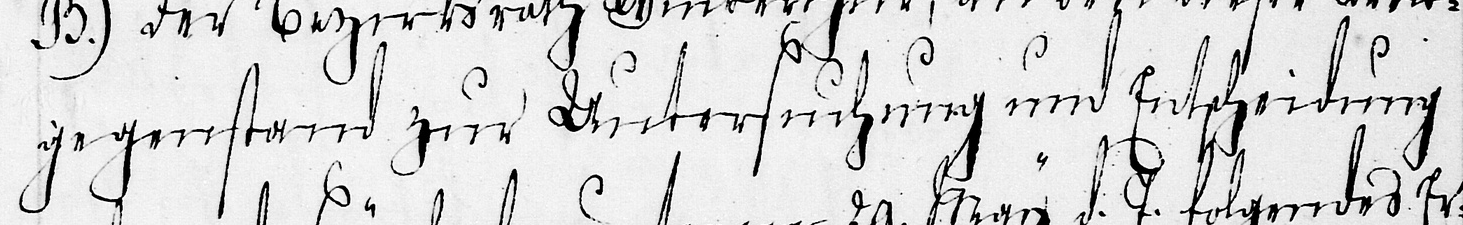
gegenstand zur Untersuchung und Entscheidung
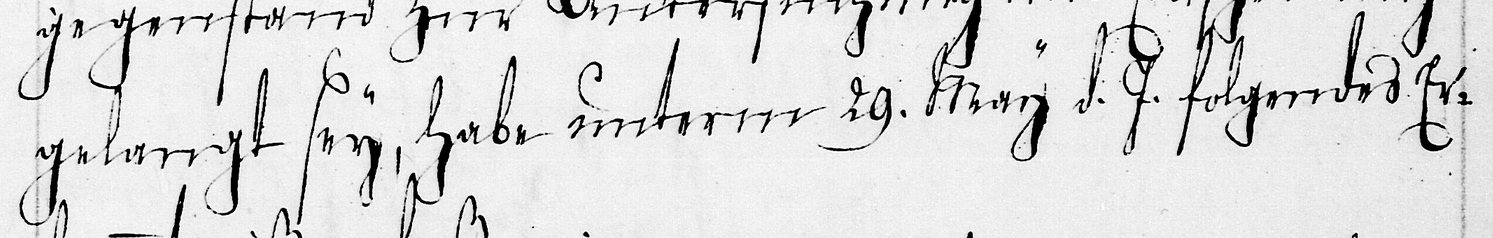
gelangt sey, habe unterm 29. May d. J. folgendes Er¬
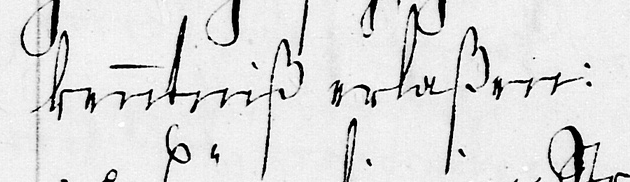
kenntniß erlaßen:
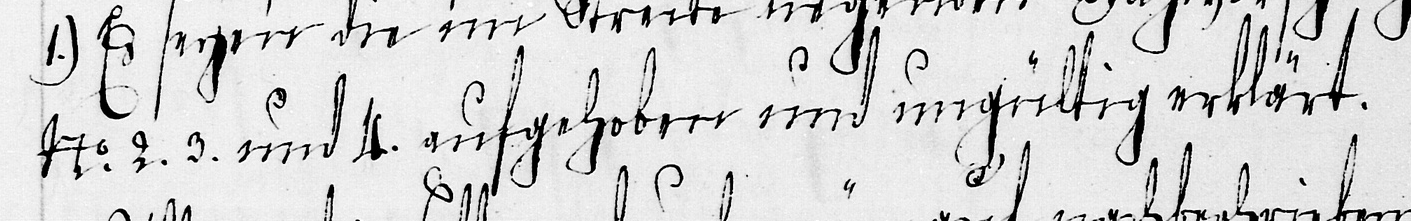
No. 2. 3. und 4. aufgehoben und ungültig erklärt.
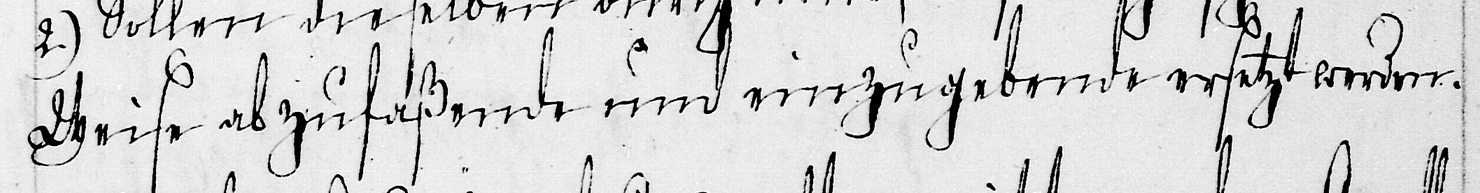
Weise abzulaßende und einzugebende ersetzt werden.
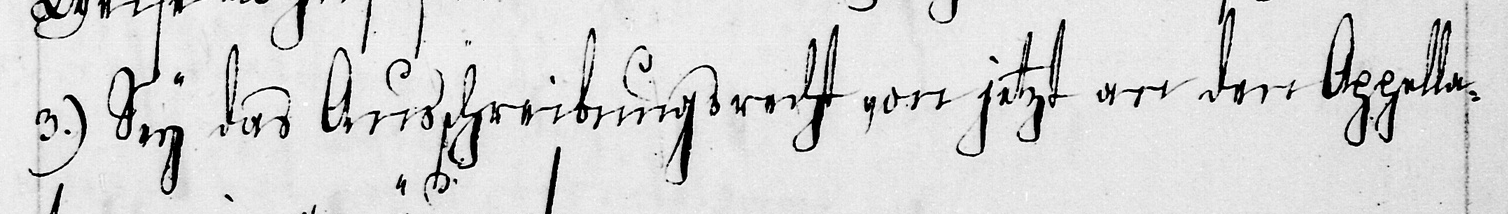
3.) Sey das Ausschreibungsrecht von jetzt an den Appella¬
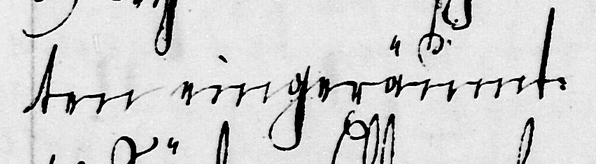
ten eingeräumt.
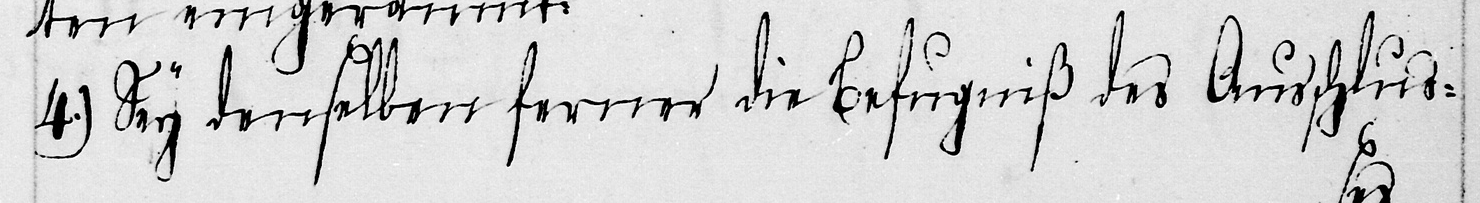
4.) Sey denselben ferner die Befugniß des Ausschlus-
